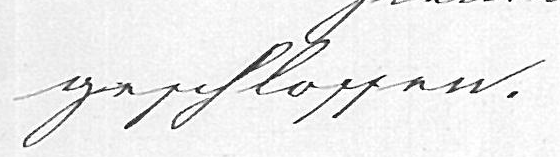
geschlossen.
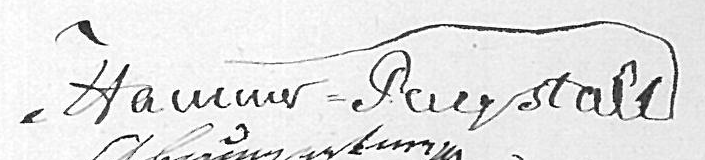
Hammer-Purgstall
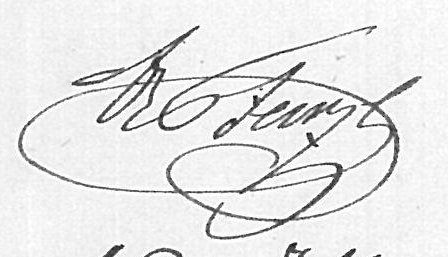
Ed Fenzl
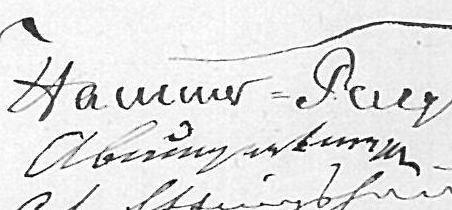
ABaumgartner
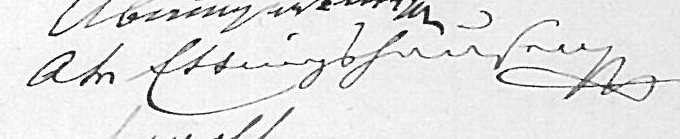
Av. Ettingshausen
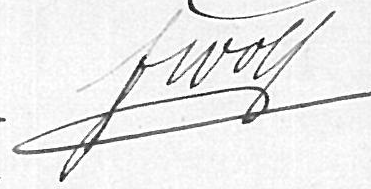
FWolf
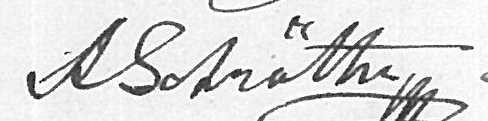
ASchrötter
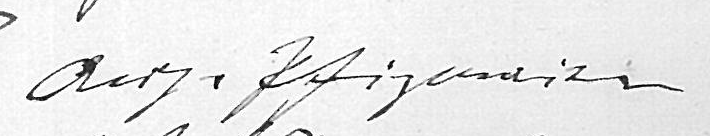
Aug. Pfizmaier
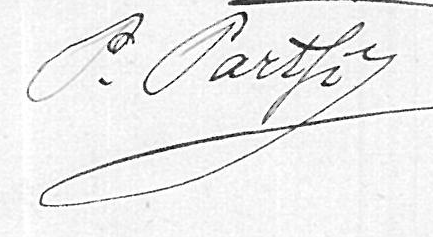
P. Partsch
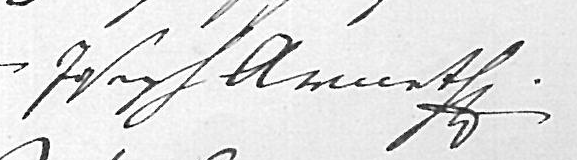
Joseph Arneth
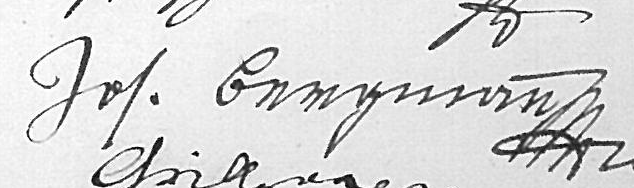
Jos. Bergmann
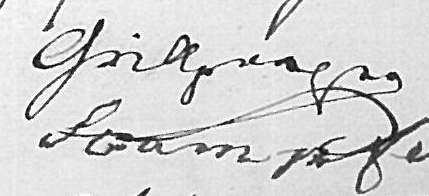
Grillparzer
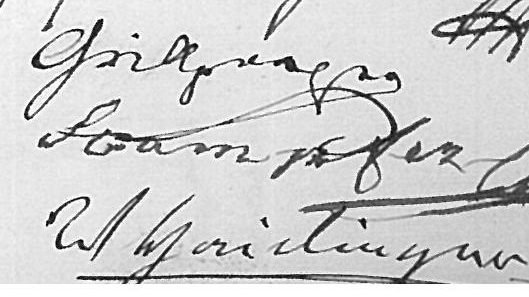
Stampfer
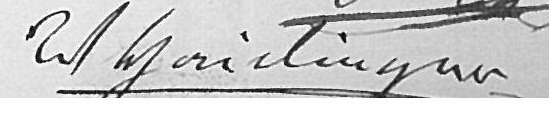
WHaidinger
